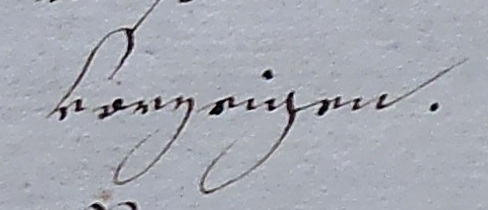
vorzeigen.
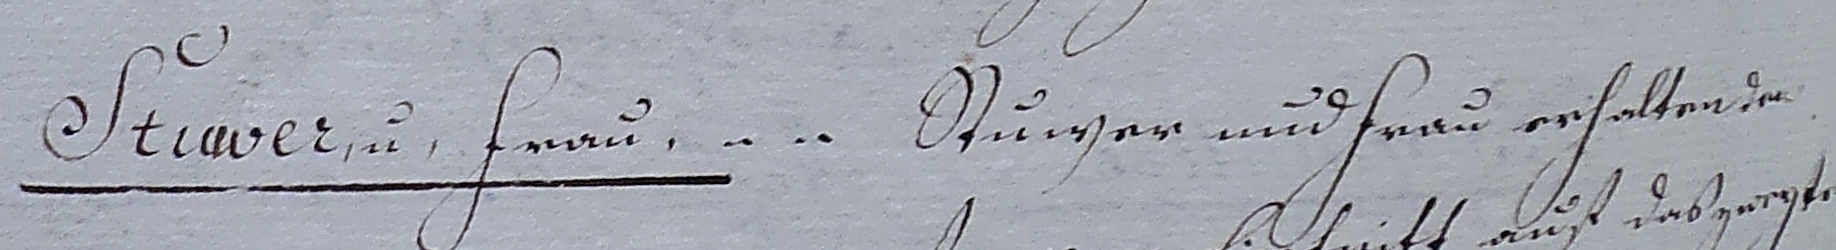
Stuwer, u, Frau. .. .. Stuwer und Frau erhalten den
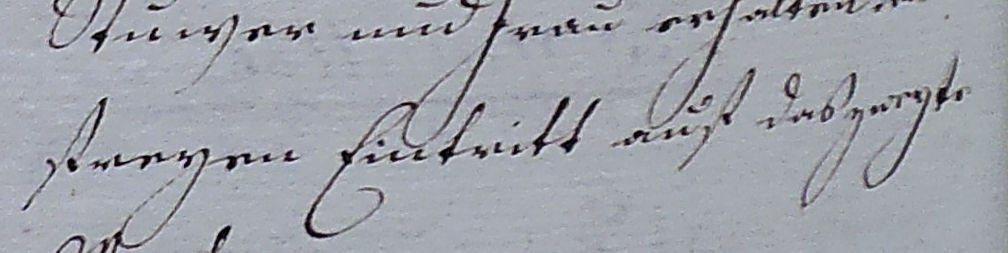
freyen Eintritt auf das zweyte
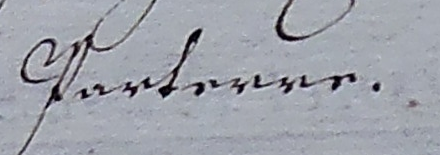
Parterre.
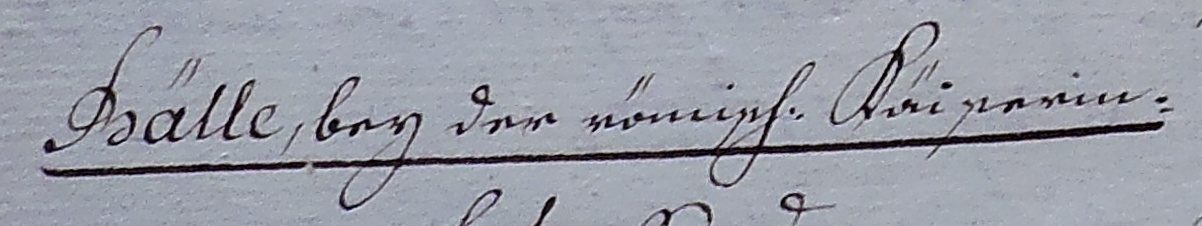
Bälle, bey der römisch: Käiserin:
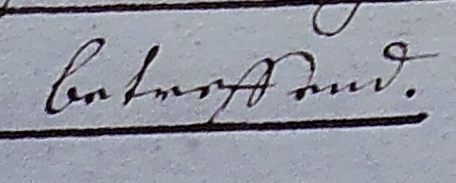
betreffend.
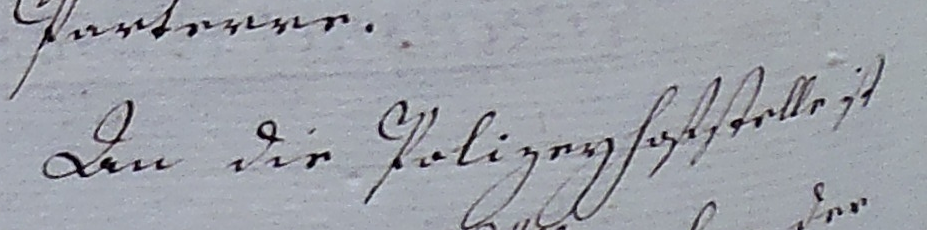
An die Polizeyhofstelle ist.
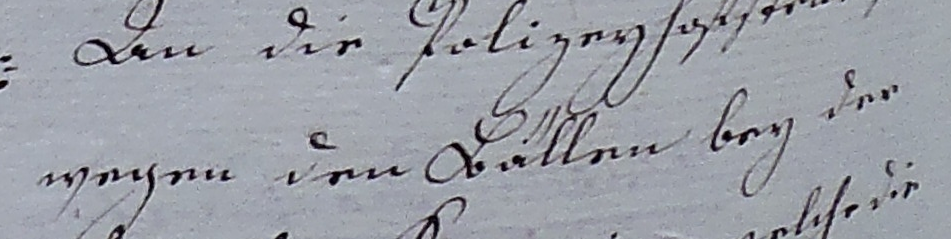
wegen den Bällen bey der
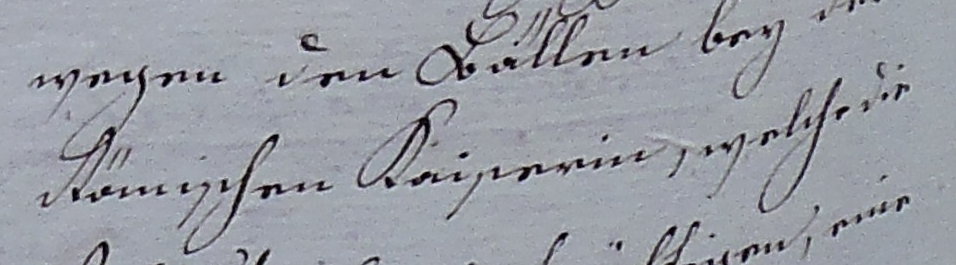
Römischen Kaiserin, welche die
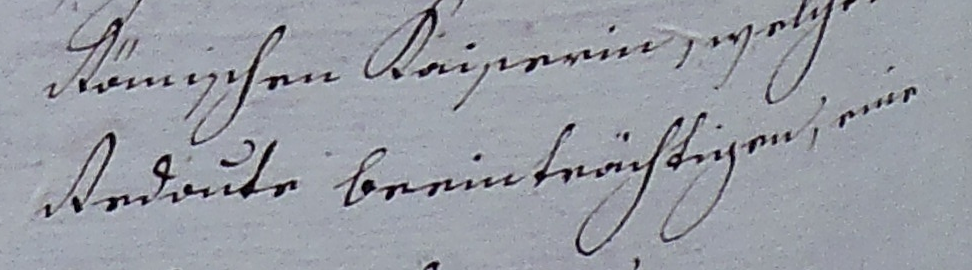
Redoute beeinträchtigen, eine
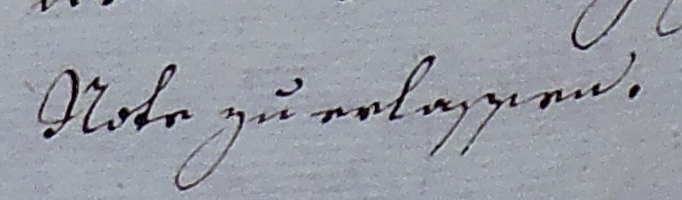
Note zu erlassen.
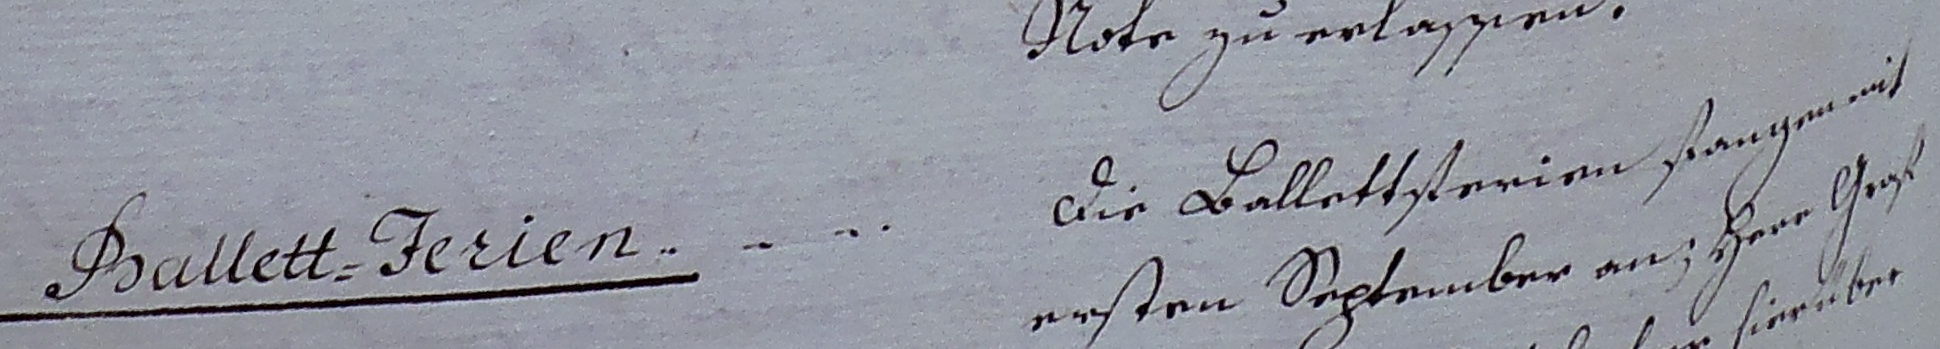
Ballett‗Ferien. .. .. . Die Ballettferien fangen mit
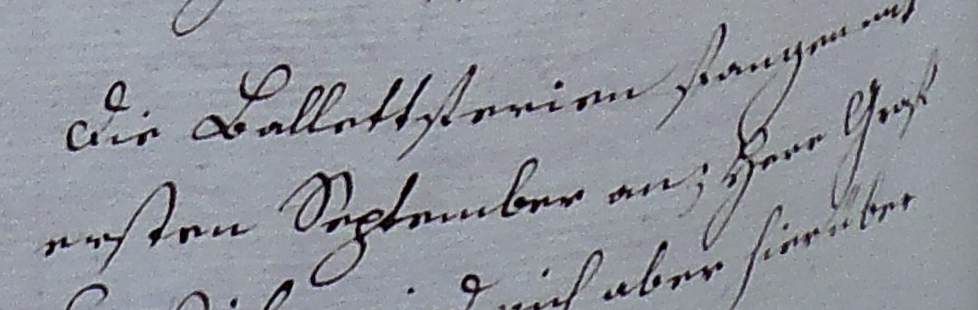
ersten September an, Herr Graf
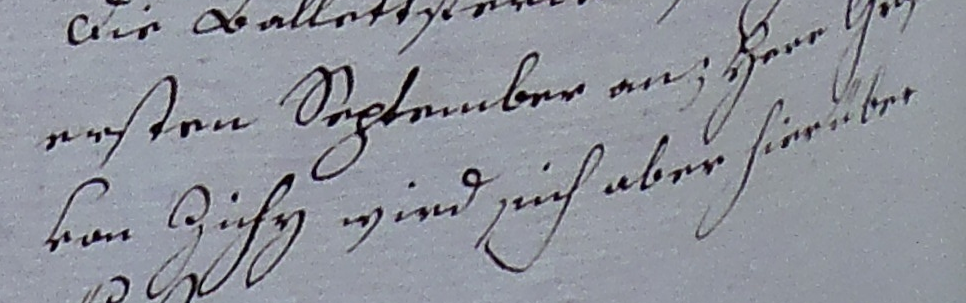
von Zichy wird sich aber hierüber
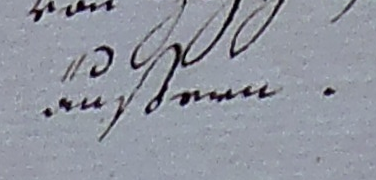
äußern.
